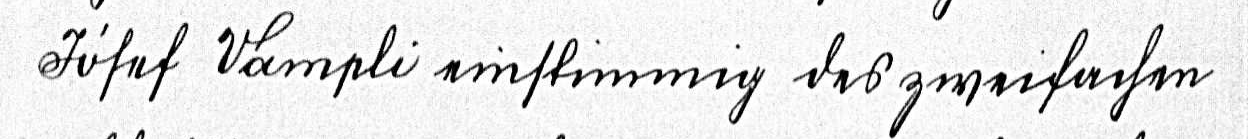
Jósef Vampli einstimmig des zweifachen
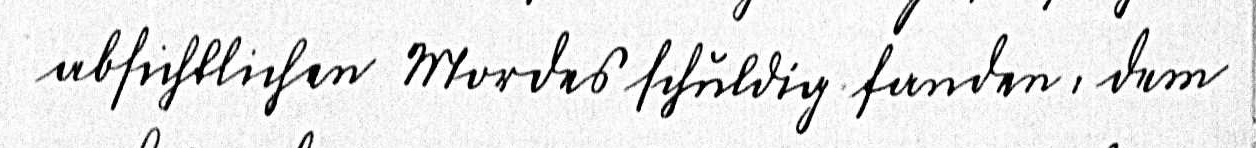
absichtlichen Mordes schuldig fanden, dem
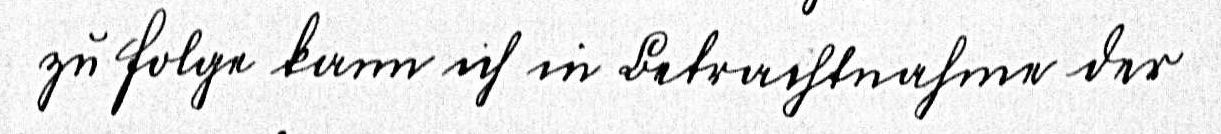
zu Folge kann ich in Betrachtnahme der
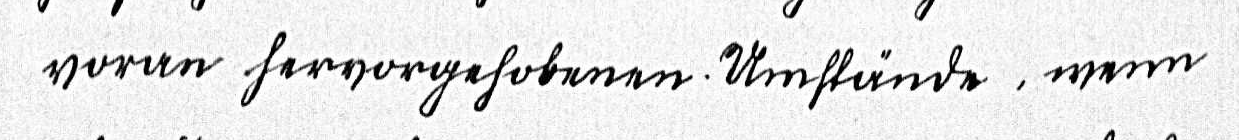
voran hervorgehobenen Umstände, wenn
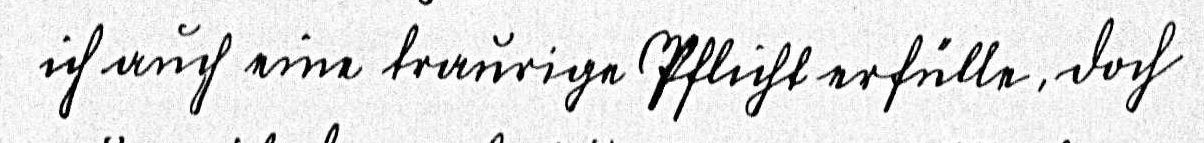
ich auch eine traurige Pflicht erfülle, doch
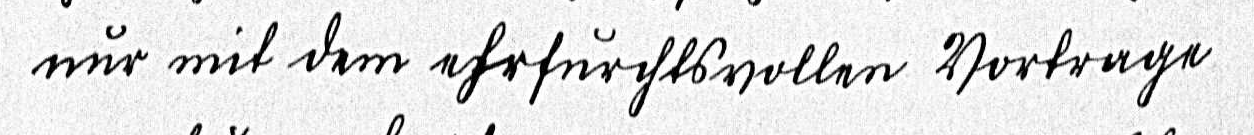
nur mit dem ehrfurchtsvollen Vortrage
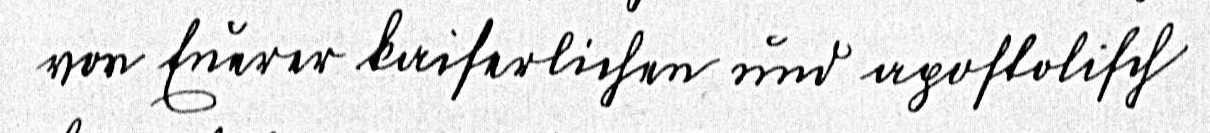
von Euerer kaiserlichen und apostolisch
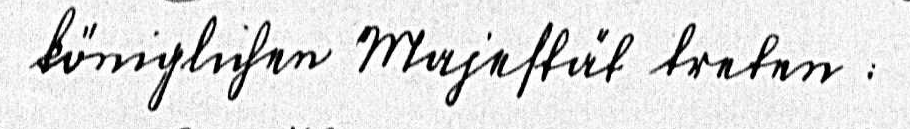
königlichen Majestät treten:
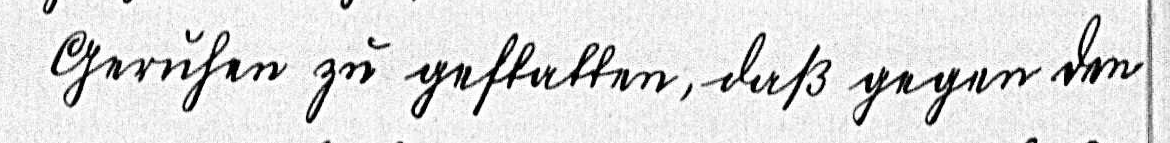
Geruhen zu gestatten, daß gegen den
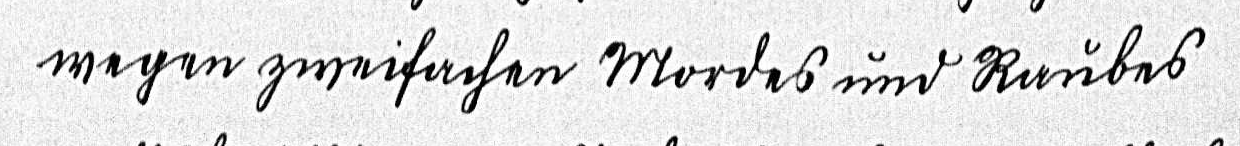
wegen zweifachen Mordes und Raubes
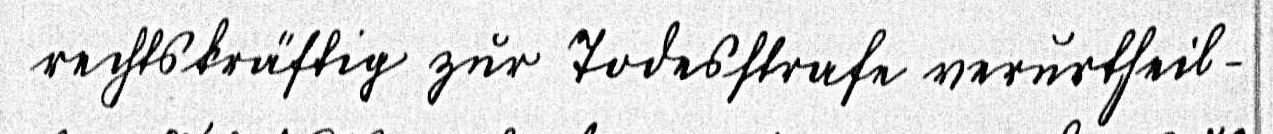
rechtskräftig zur Todesstrafe verurtheil¬
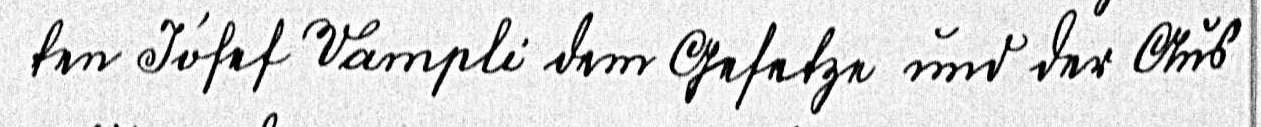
ten Jósef Vampli dem Gesetze und der Aus¬
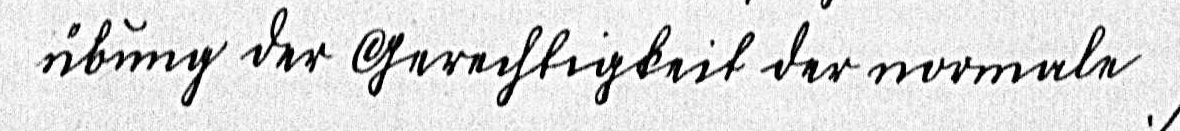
übung der Gerechtigkeit der normale
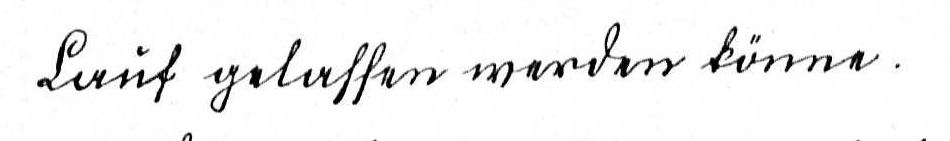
Lauf gelassen werden könne.
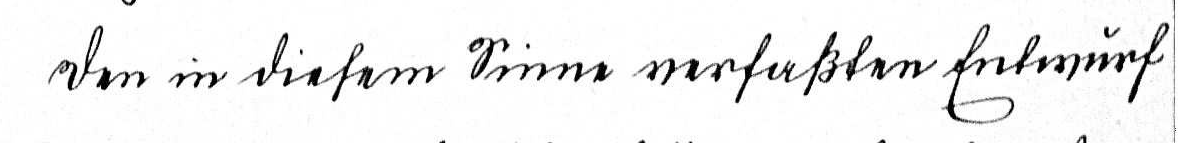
Den in diesem Sinne verfaßten Entwurf
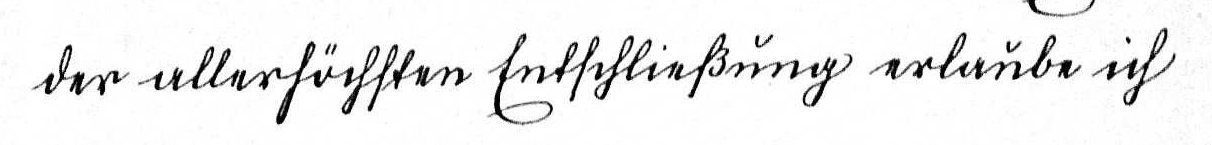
der allerhöchsten Entschließung erlaube ich
